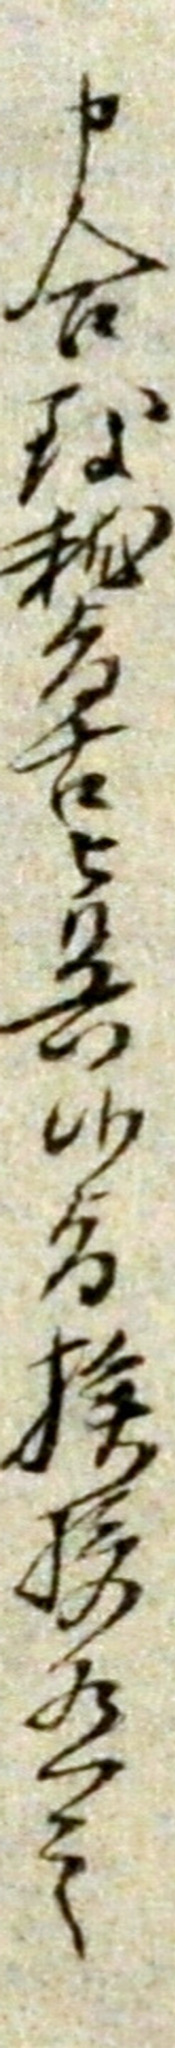申合致稽古被呉候旨挨拶有之
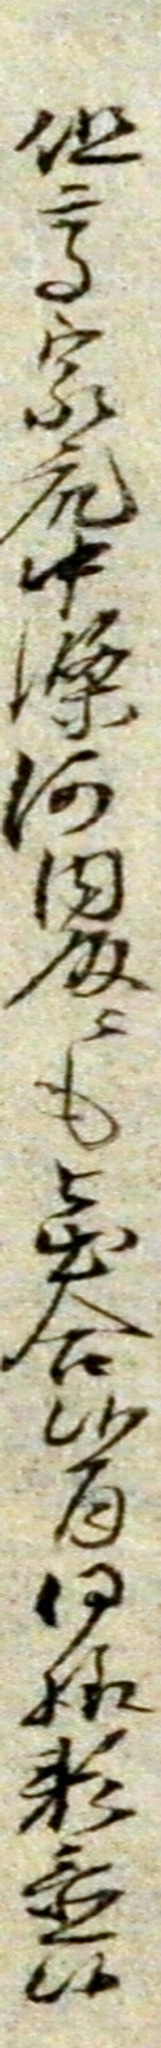但高家衆中條河内守殿ニも出合候間同様頼置候
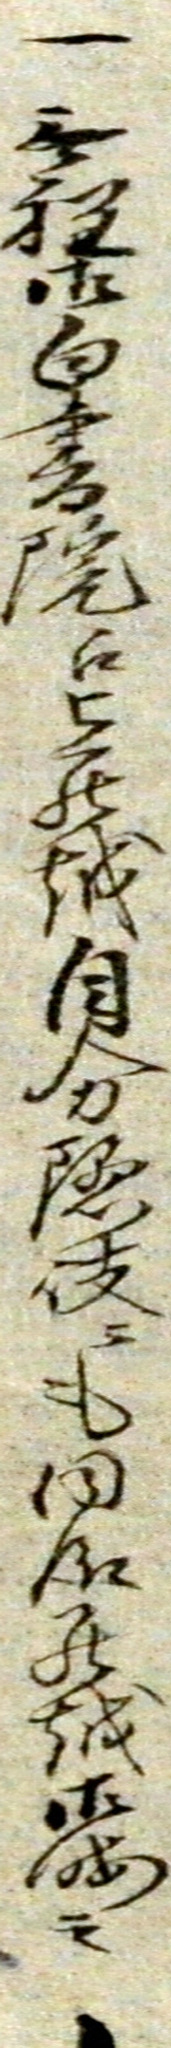一無程御白書院江被罷越自分隠岐ニも同様罷越御咄暇之
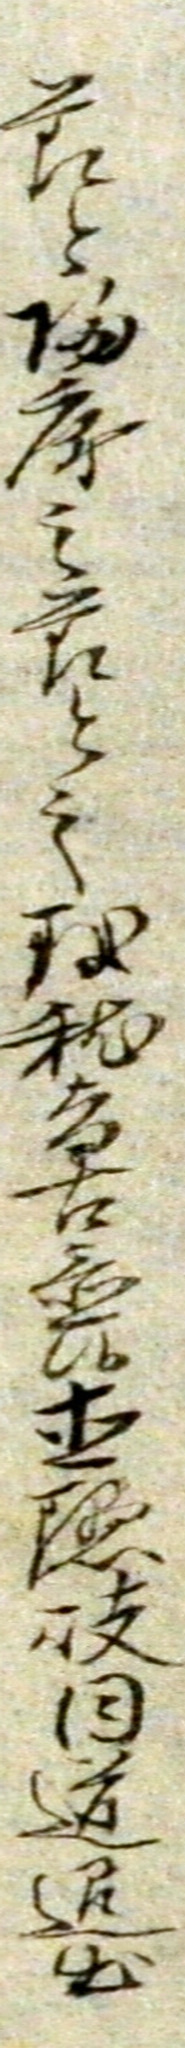節と帰序之節と之致稽古置候直隠岐同道退出
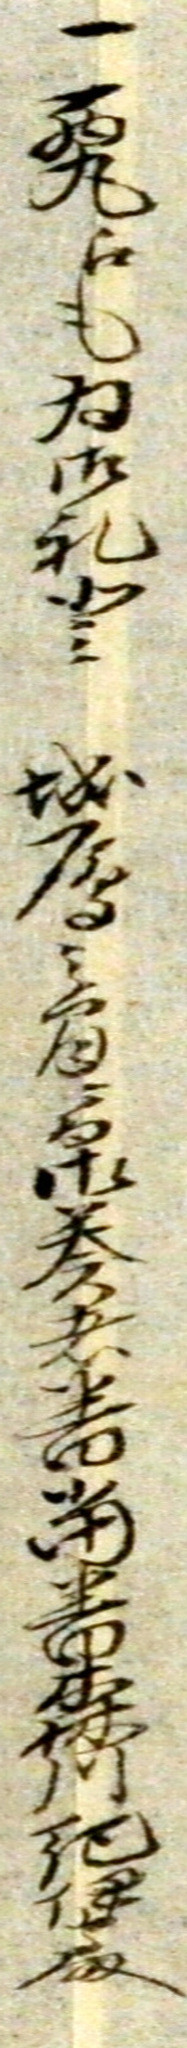一西丸江も為御礼登城雁之間ニ而御奏者番当番森川紀伊守殿
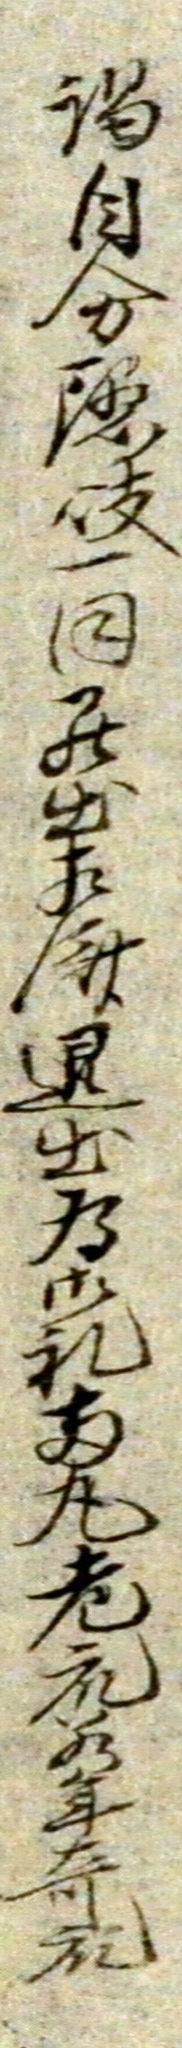謁自分隠岐一同罷出相済退出為御礼両丸老衆若年寄衆
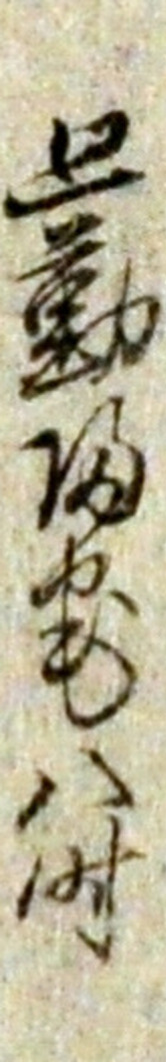廻勤帰宅八時
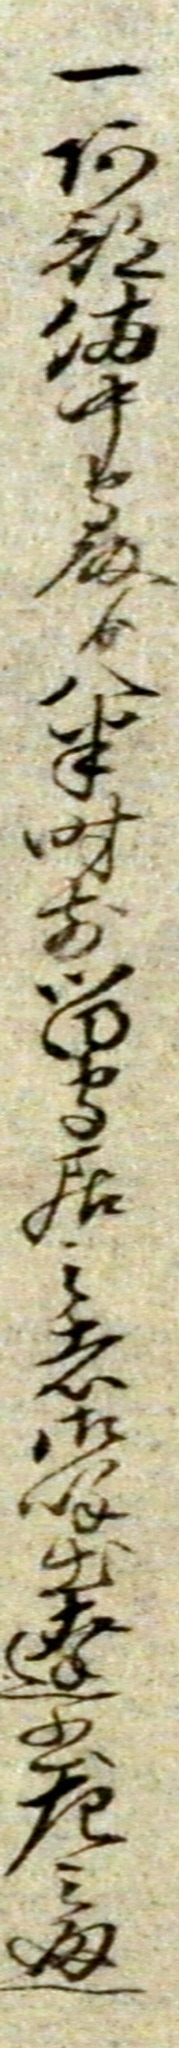一阿部備中守殿ゟ八半前留守居之者御呼出達書左之通
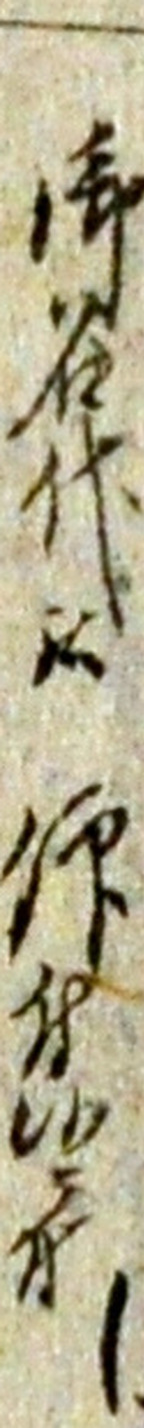御名代被仰付候ニ付
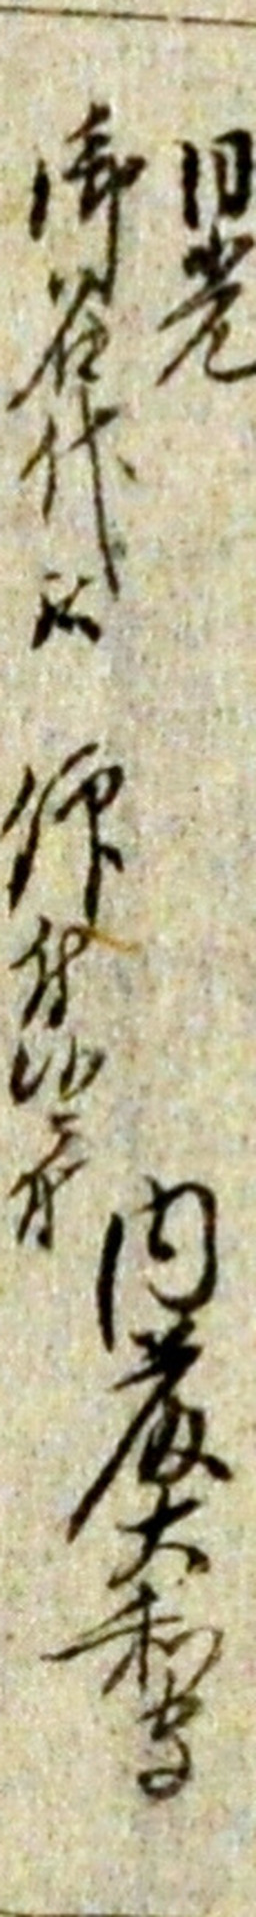御名代被仰付候ニ付
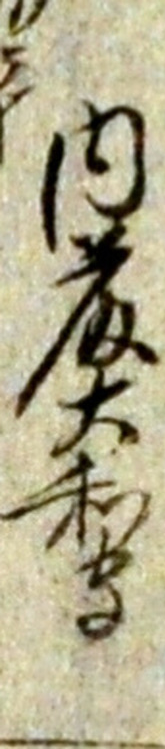日光内藤大和守
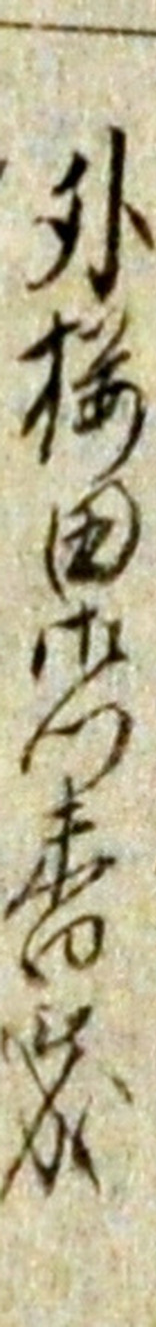外櫻田御門番被成
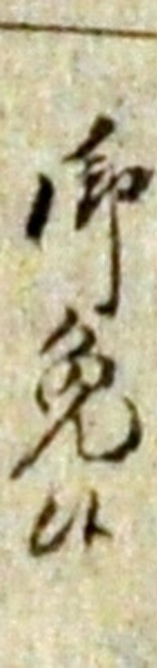御免候
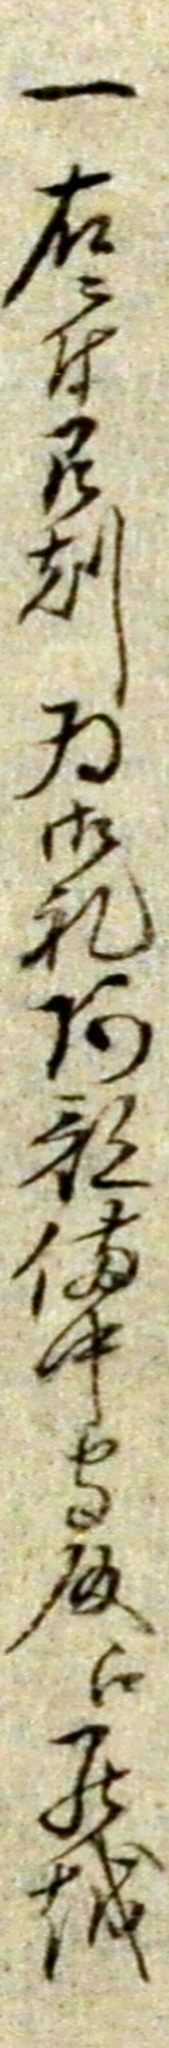一右ニ付即刻為御礼阿部備中守殿江罷越
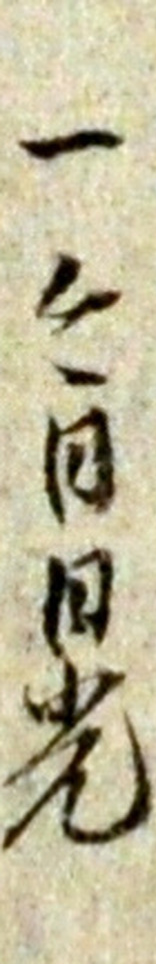一今日日光
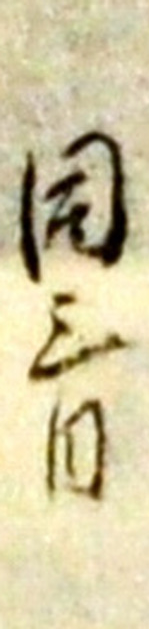同四日
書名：日光御名代相勤候節ノ留
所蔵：伊那市立高遠町図書館・合同会社AMANE
